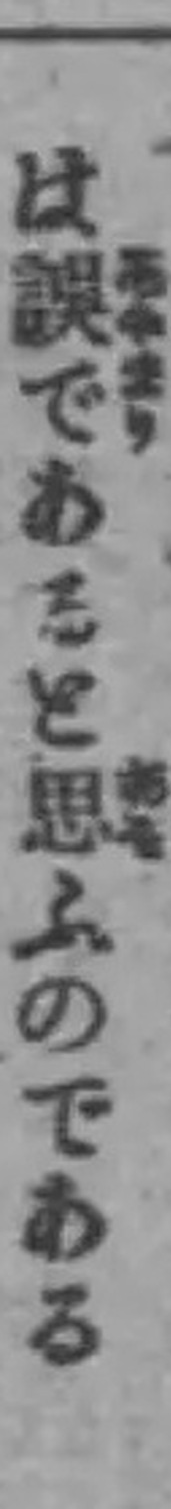は誤であると思ふのである
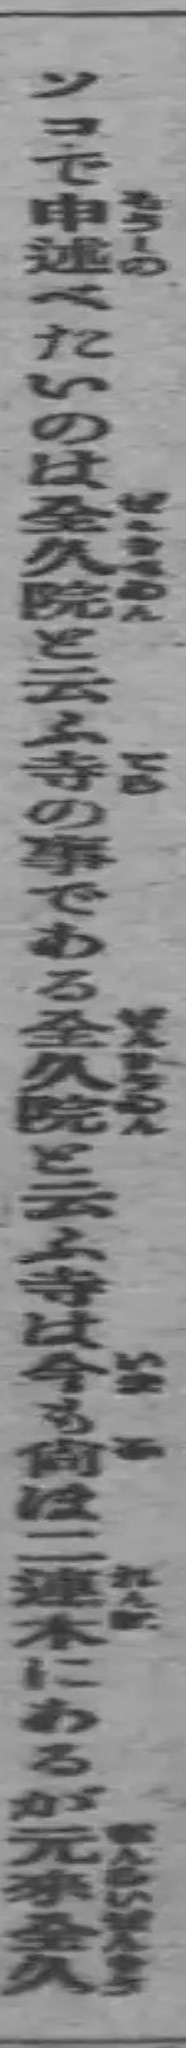全久院ソコで申述べたいのは全久院と云ふ寺の事である全久院と云ふ寺は今も尚ほ二連木にあるが元来全久
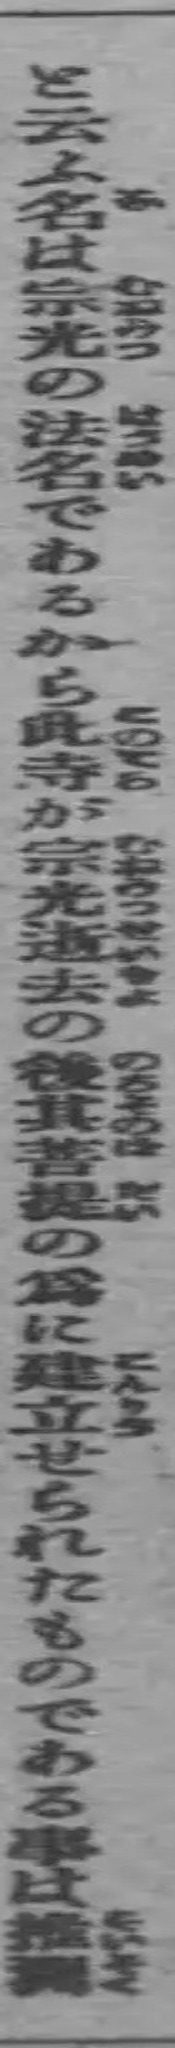と云ふ名は宗光の法名であるから此寺が宗光逝去の後其菩提の為に建立せられたものである事は推測
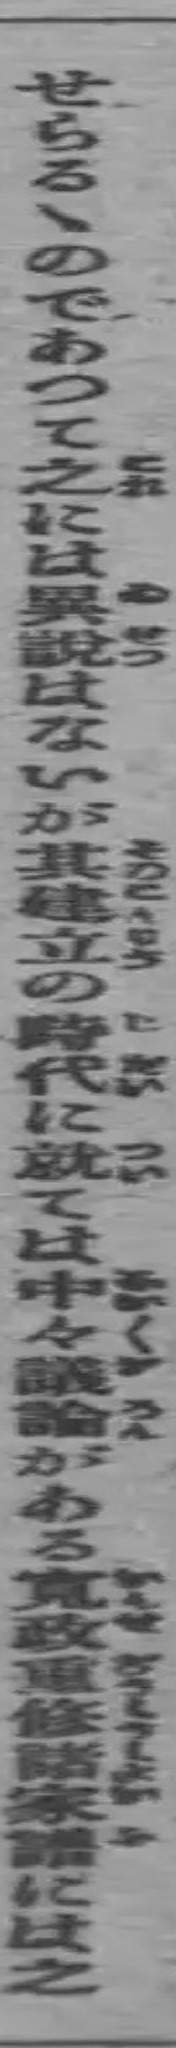せらるゝのであつて之には異説はないが其建立の時代に就ては中々議論がある寛政重修諸家譜には之
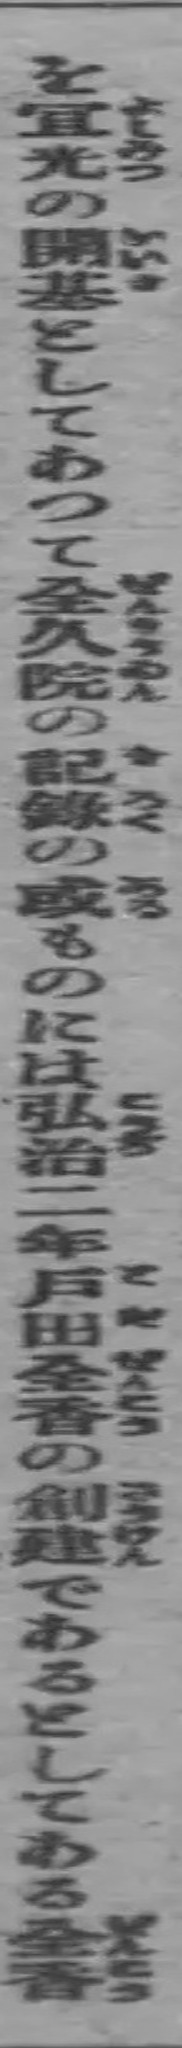を冝光の開基としてあつて全久院の記録の或ものには弘治二年戸田全香の創建であるとしてある全香
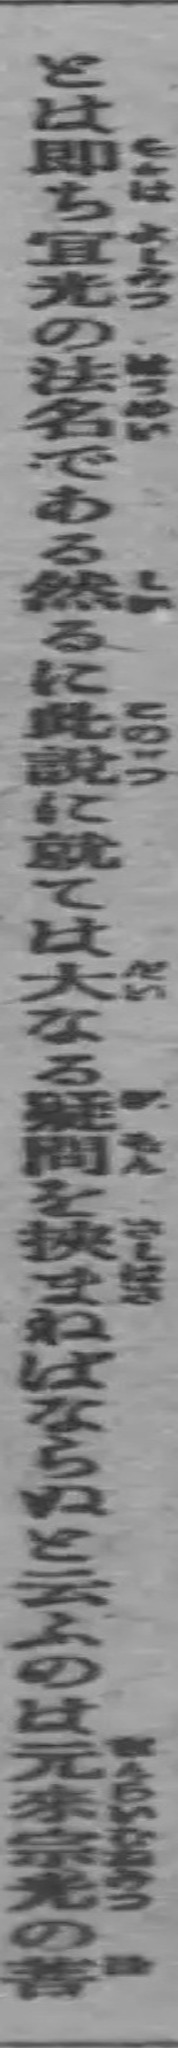とは即ち冝光の法名である然るに此説に就ては大なる疑問を挟まねばならぬと云ふのは元来宗光の菩
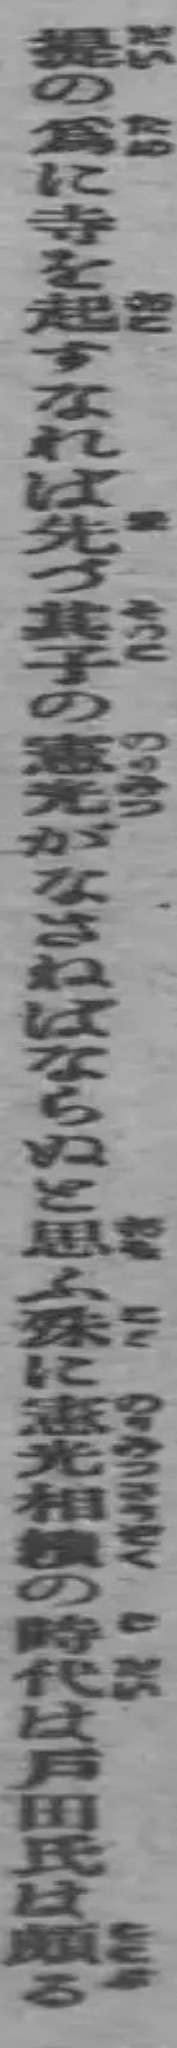提の為に寺を起すなれば先づ其子の憲光がなさねばならぬと思ふ殊に憲光相続の時代は戸田氏は頗る
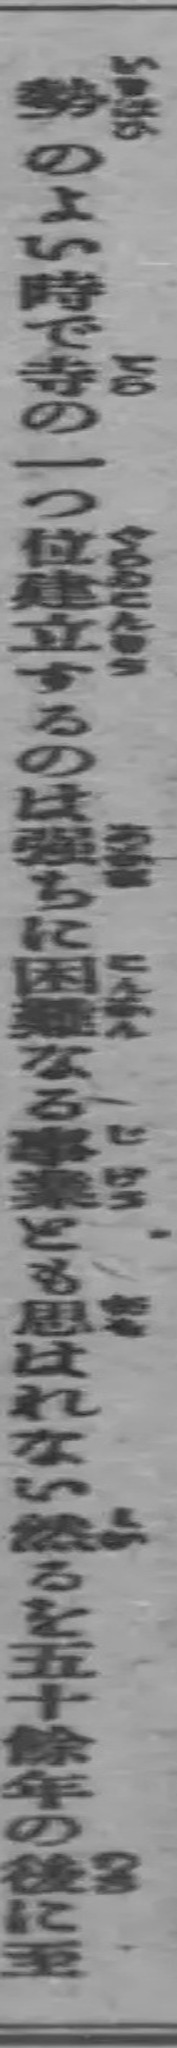勢のよい時で寺の一つ位建立するのは強ちに困難なる事業とも思はれない然るを五十余年の後に至
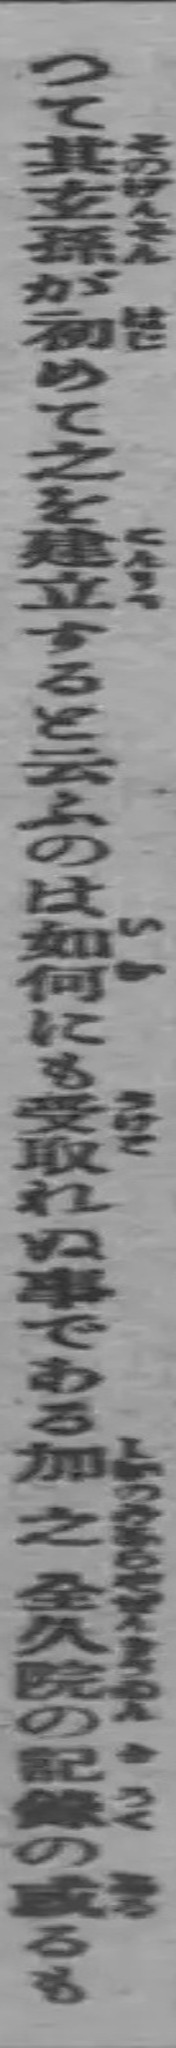つて其玄孫が初めてこれ建立すると云ふのは如何にも受取れぬ事である加之全久院の記録の或るも
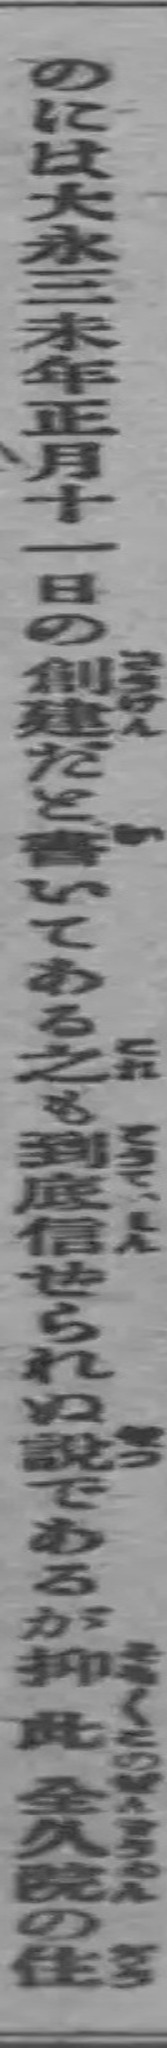のには大永三未年正月十一日の創建だと書いてある之も到底信ぜられぬ説であるが抑此全久院の住
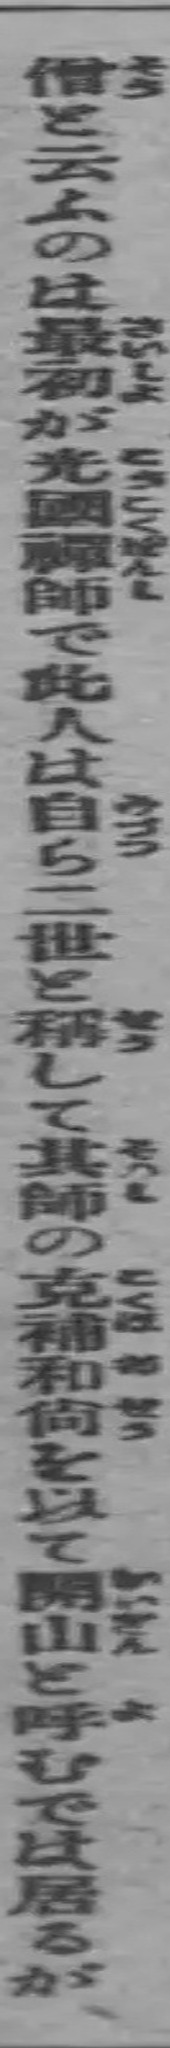光国禅師僧と云ふのは最初が光国禅師で此人は自ら二世と称して其師の克補和尚を以て開山と呼むでは居るが
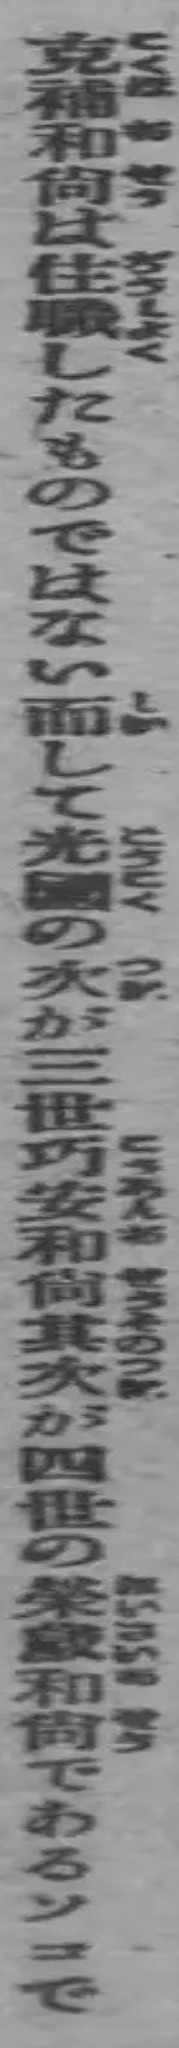克補和尚は住職したものではない而して光国の次が三世巧安和尚其次が四世の栄歳和尚であるソコで
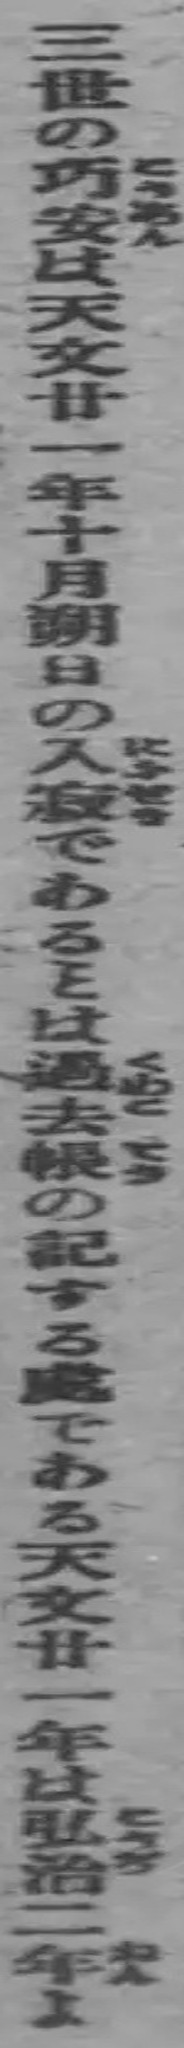三世の巧安は天文廿一年十月朔日の入寂であることは過去帳の記する処である天文廿一年は弘治二年よ

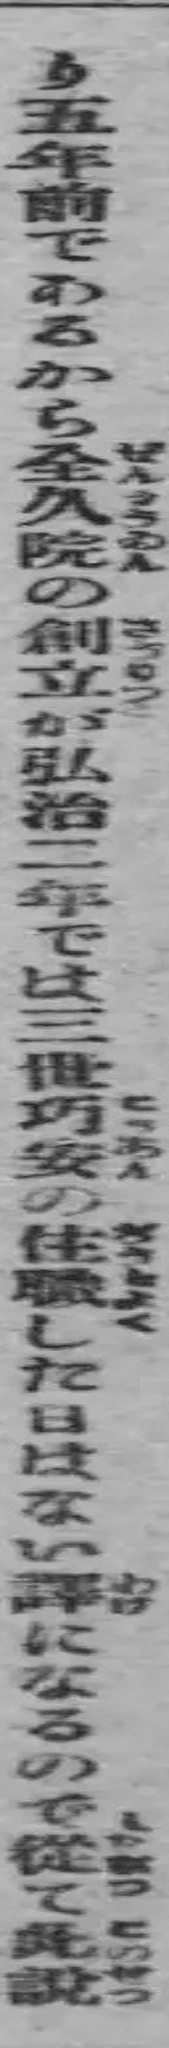り五年前であるから全久院の創立が弘治二年では三世巧安の住職した日はない訳になるので従て此説
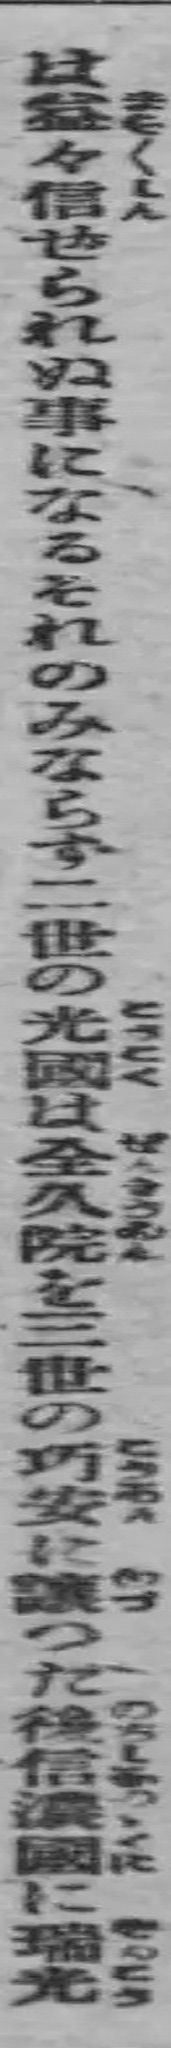は益々信ぜられぬ事になるそれのみならず二世の光国は全久院を三世の巧安に譲つた後信濃国に瑞光
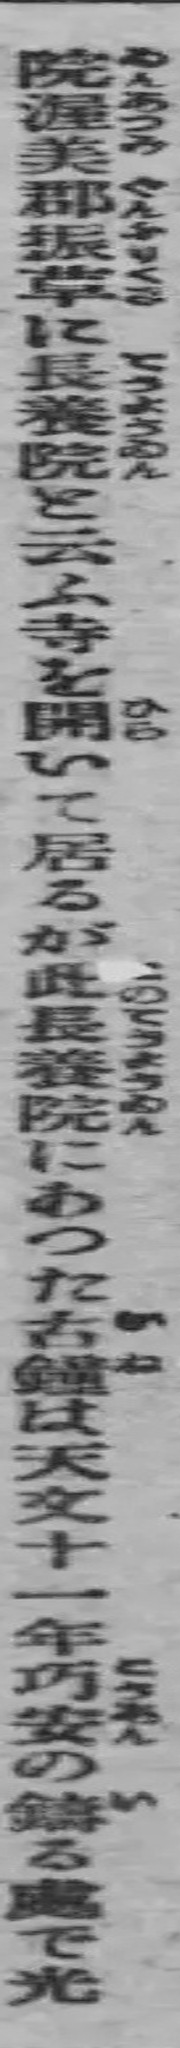院渥美郡振草に長養院と云ふ寺を開いて居るがこ此長養院にあつた古鐘は天文十一年巧安の鋳る処で光
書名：豊橋市史談
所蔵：国立国会図書館 National Diet Library, JAPAN
